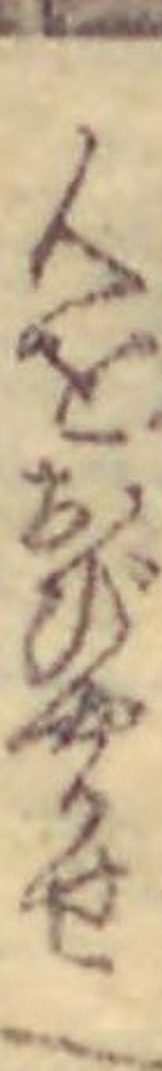人をおびやかせ
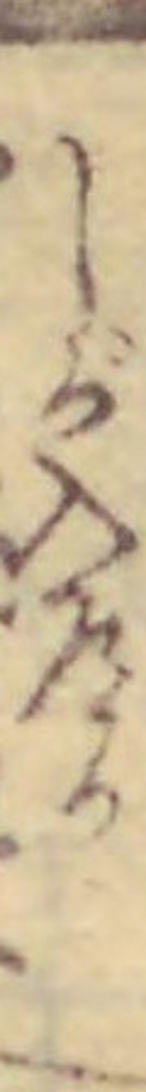しが入道か
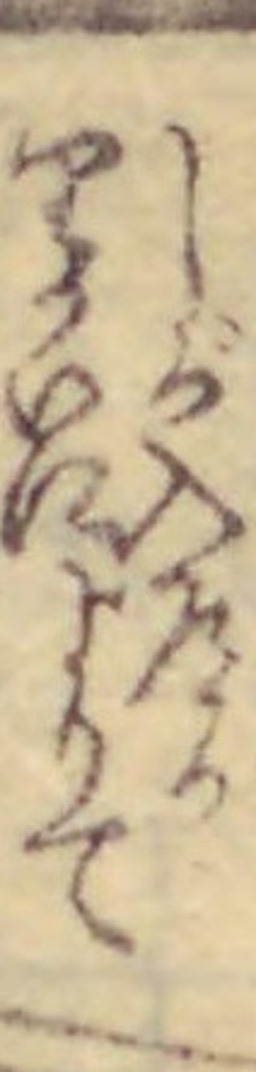りかいによりて
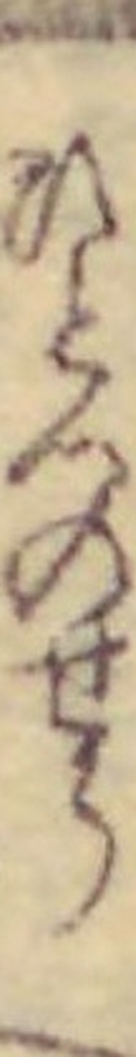ひとつのせう
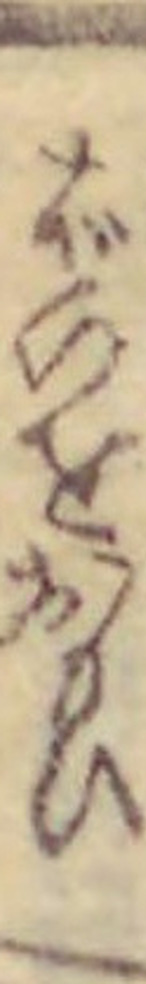ばいをおもひ
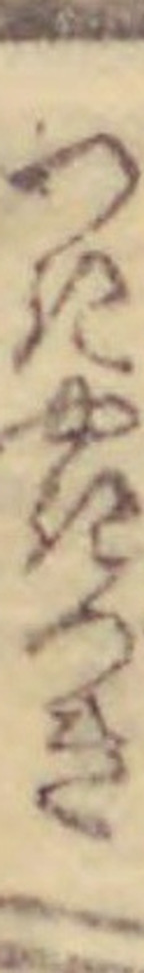つきやきつき
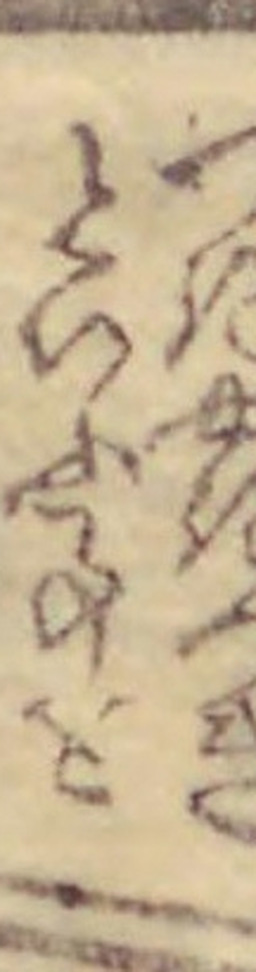といふ事を
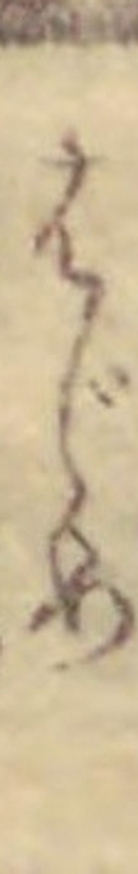はじめ
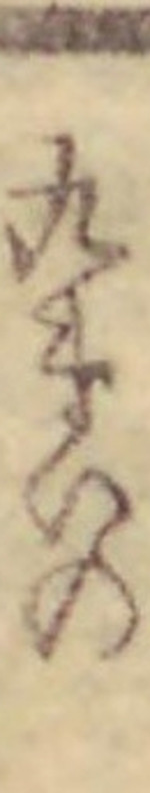九まいの
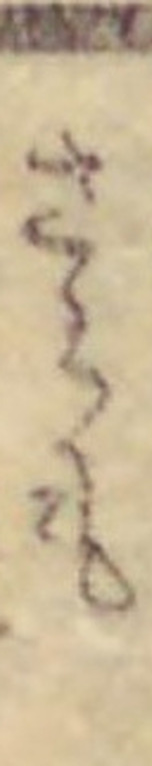さらも
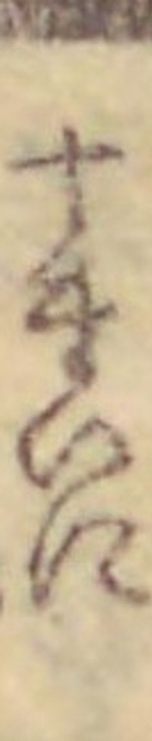十まいに
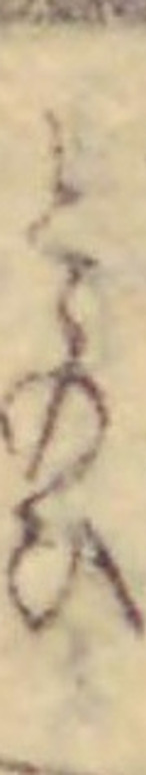とゝのひ
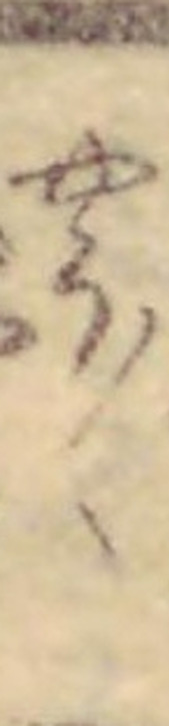やう〳〵
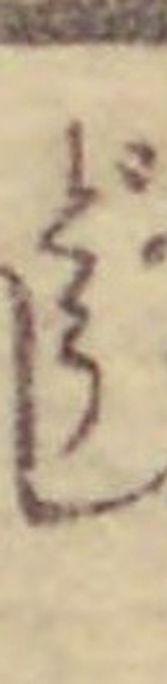どうし
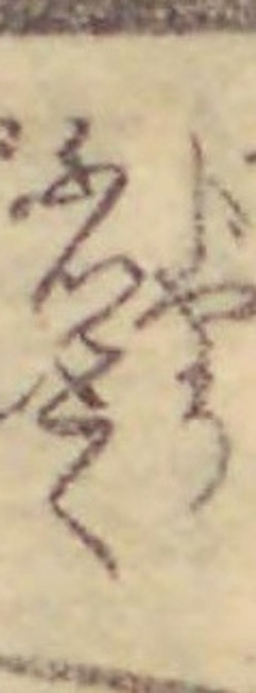ふつとく
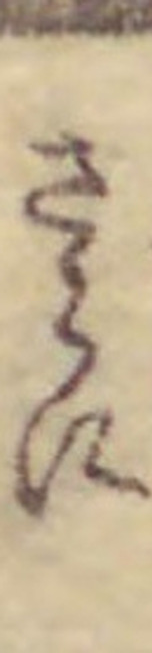さらに
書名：化物世帯氣質
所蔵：国立国会図書館 National Diet Library, JAPAN
